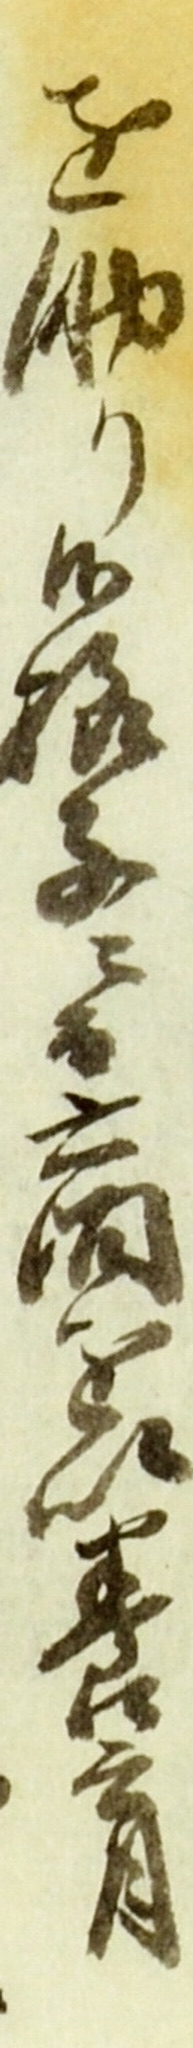を助り候様子ニ而商を以養育
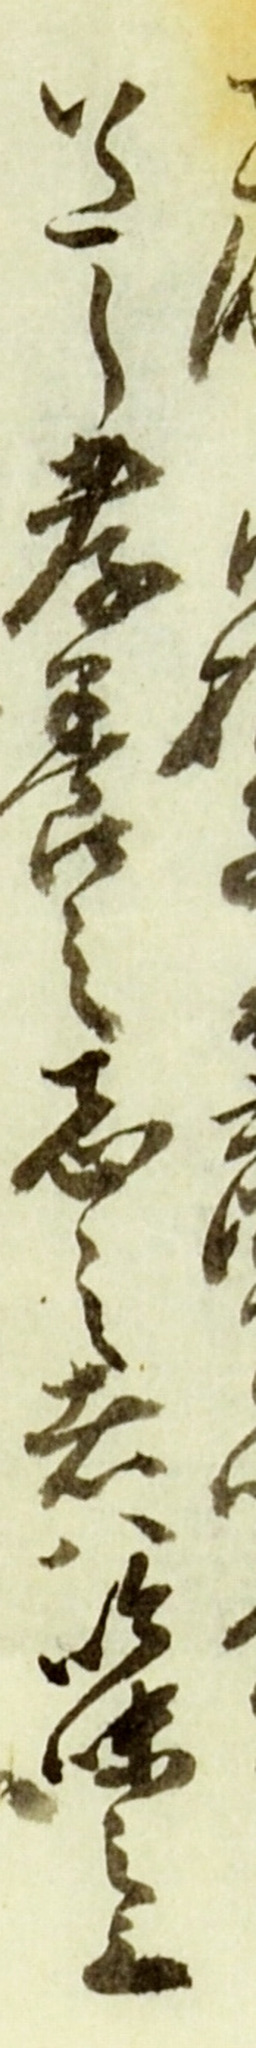いたし孝善之志之者ハ吟味之上
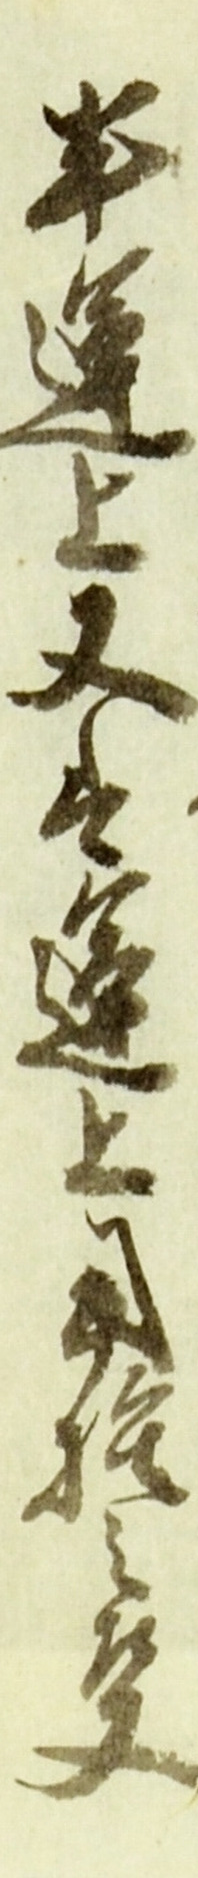半運上又は運上用捨之事
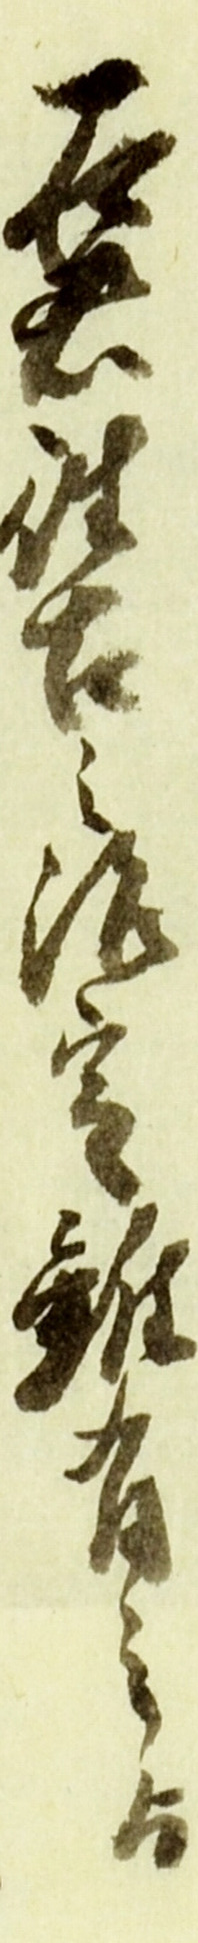右者往古之治定難有之与
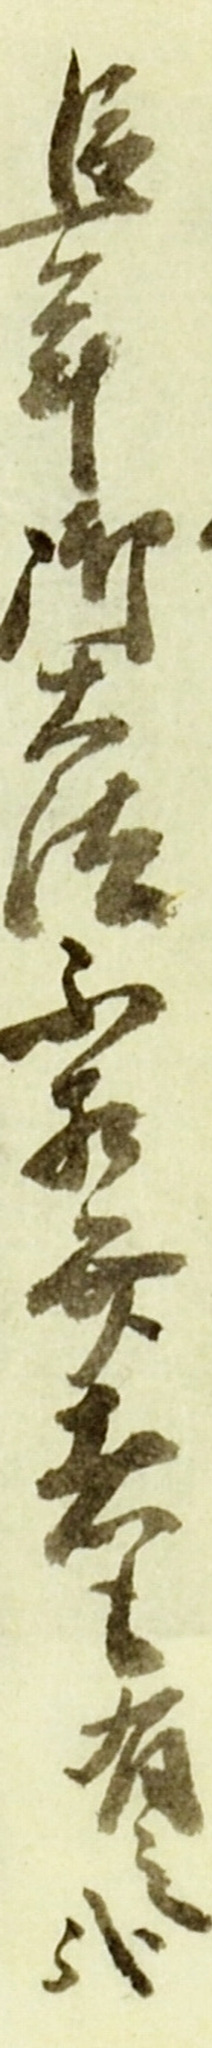追年御大法不相弁者も有之哉
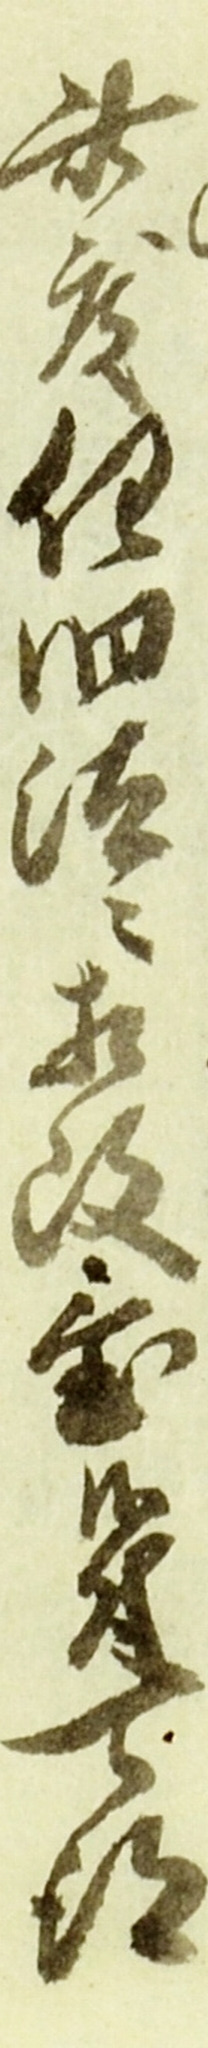此度任旧法ニ相改置候付可得
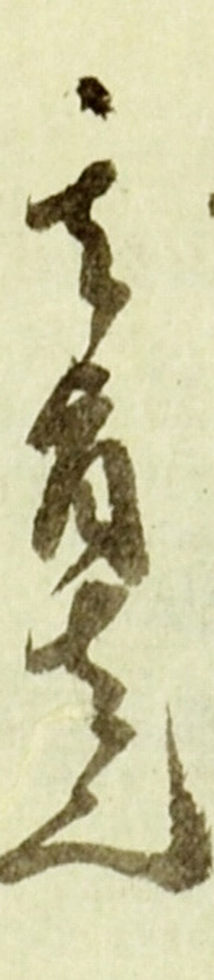其旨者也
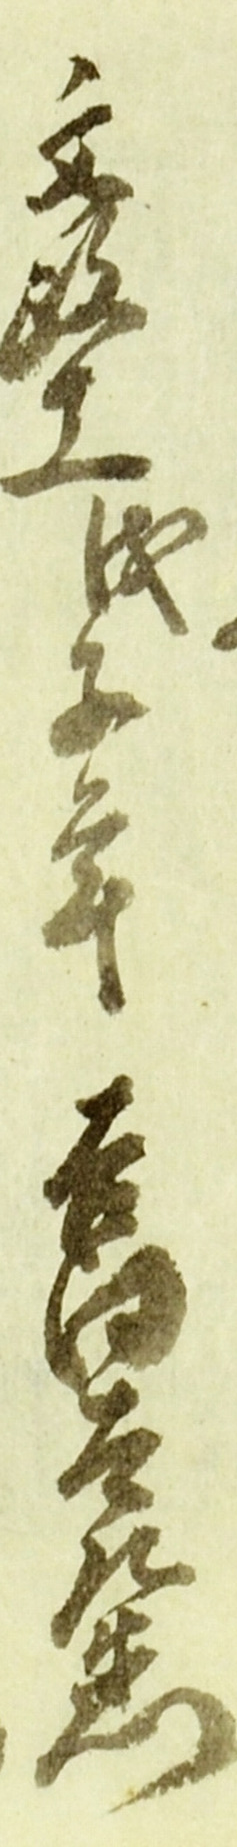文政十一戊子年吉田太左衛門
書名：分一方諸運上御定法
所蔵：伊那市立高遠町図書館・合同会社AMANE
